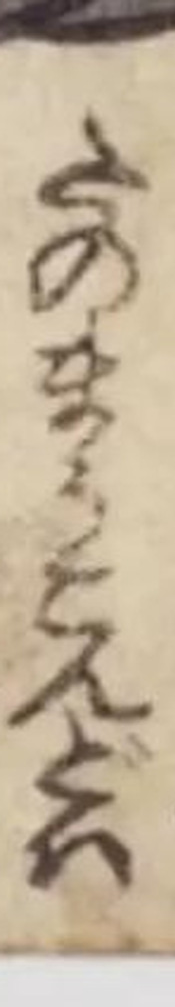たのまうこんどは
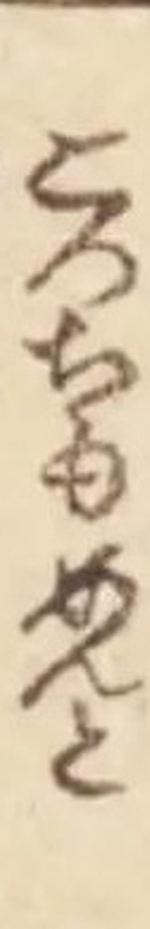こつちもぬんと
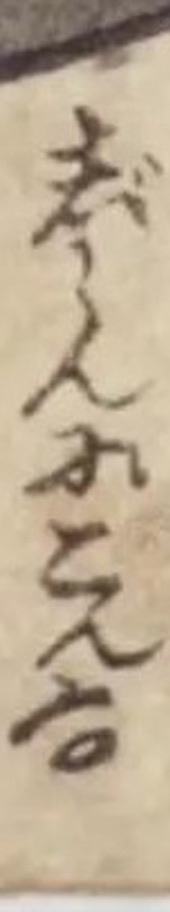じしんにこんな
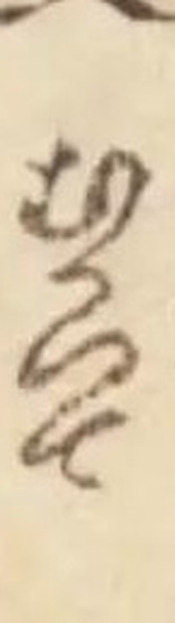むかつて
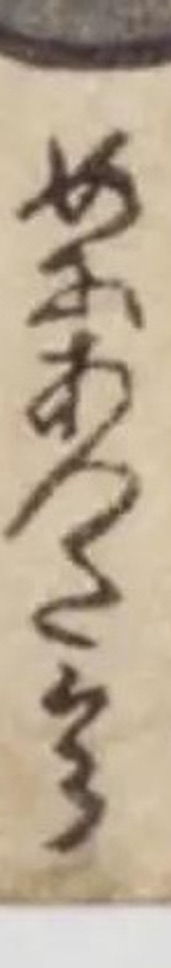めにあつたから
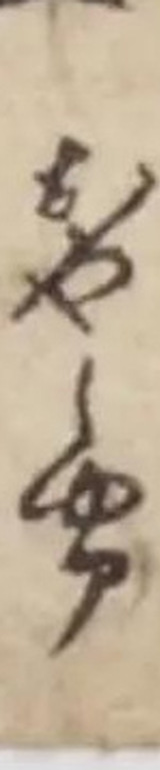おやしやア
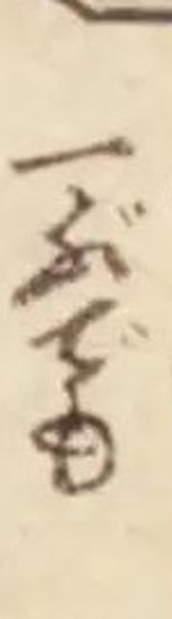一ぶでも
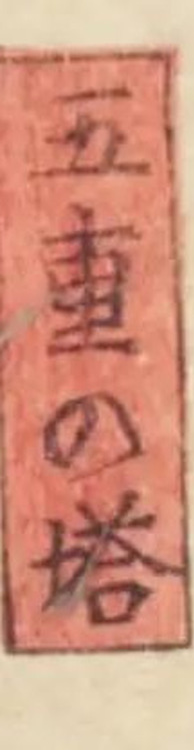五重の塔
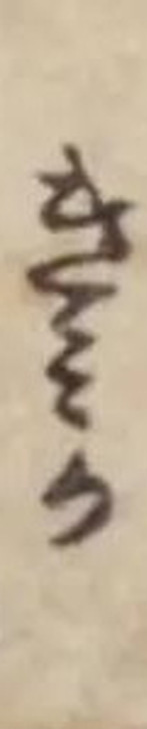きみか
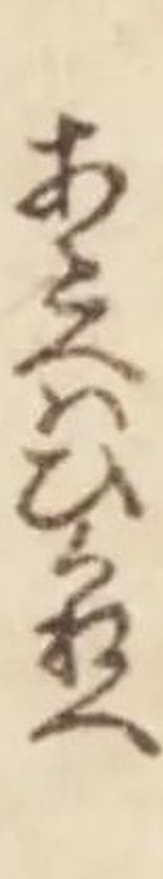あとへはひかねへ
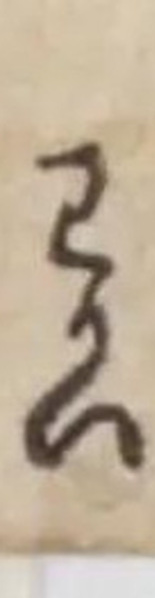わりい
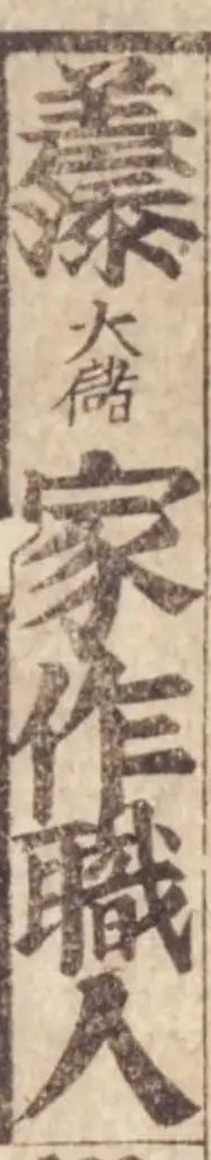差添大儲家作職人
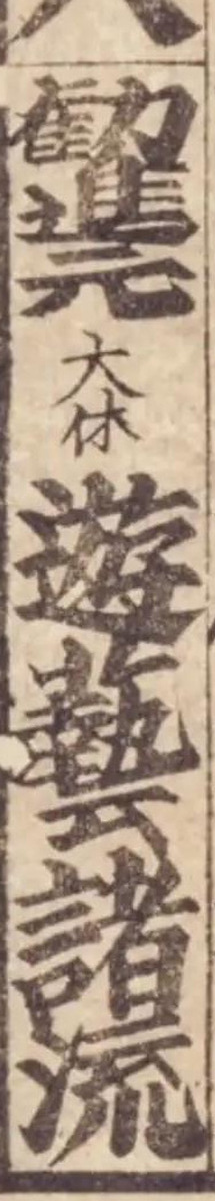勧進元大休遊芸諸流
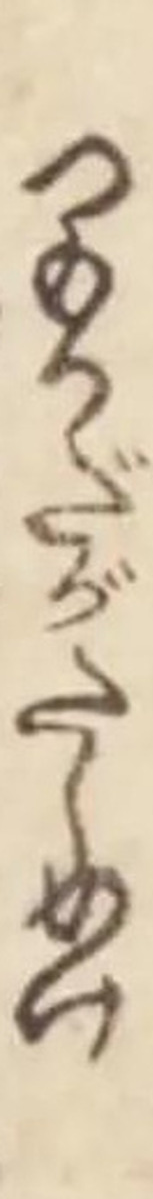つもりだがたしぬけ
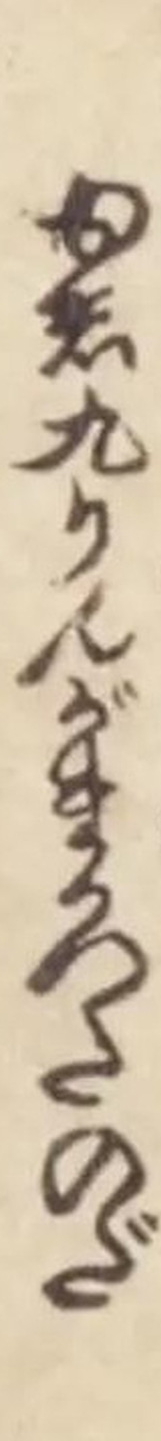ゆゑ九りんがまかつたのだ
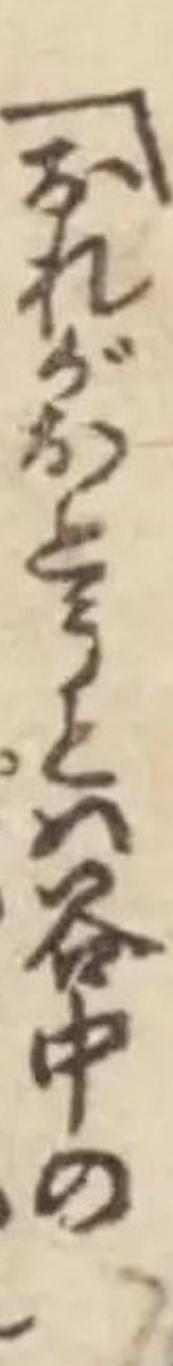「おれがおとうとは谷中の
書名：安政二年十月二日地震出火後日角力
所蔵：国立国会図書館 National Diet Library, JAPAN
